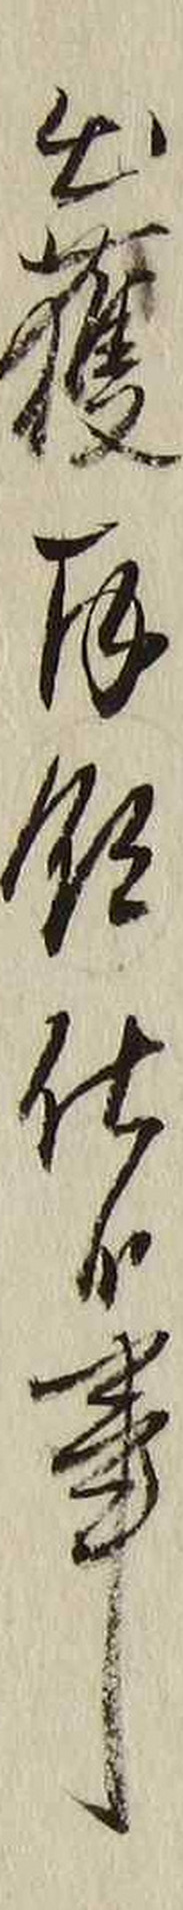出獲拝領仕候事
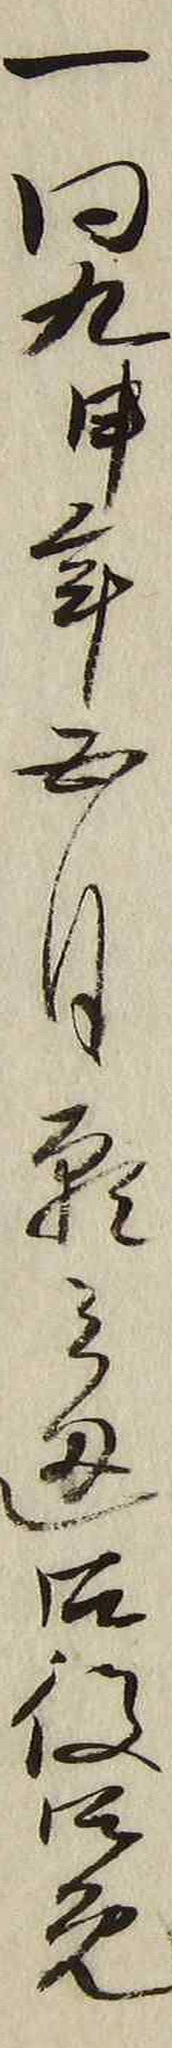一同九申年五月願之通御役御免
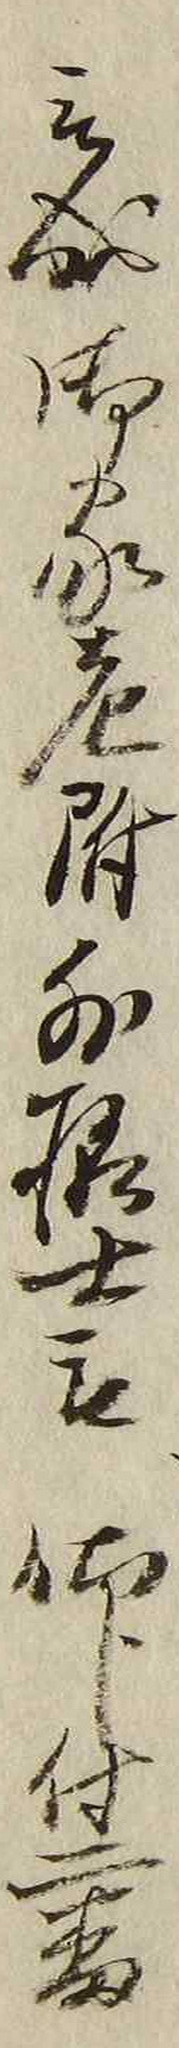被成御家老附外様士被仰付二番

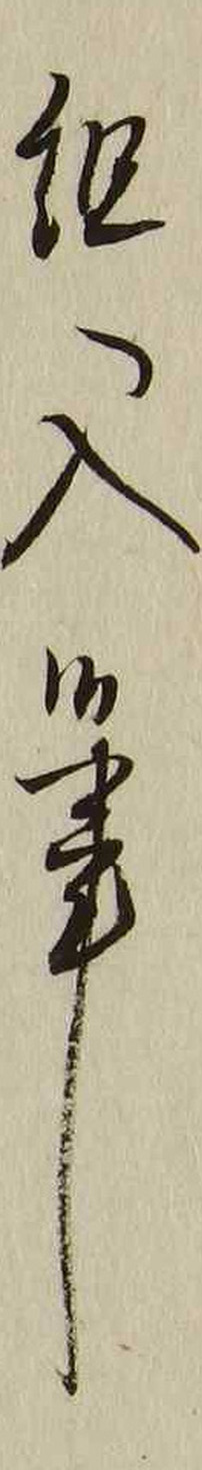組へ入候事
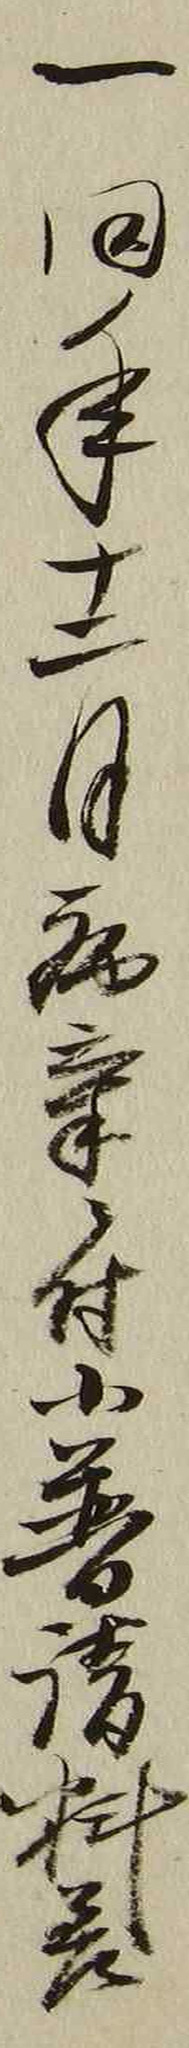一同年十二月病気ニ付小普請料差
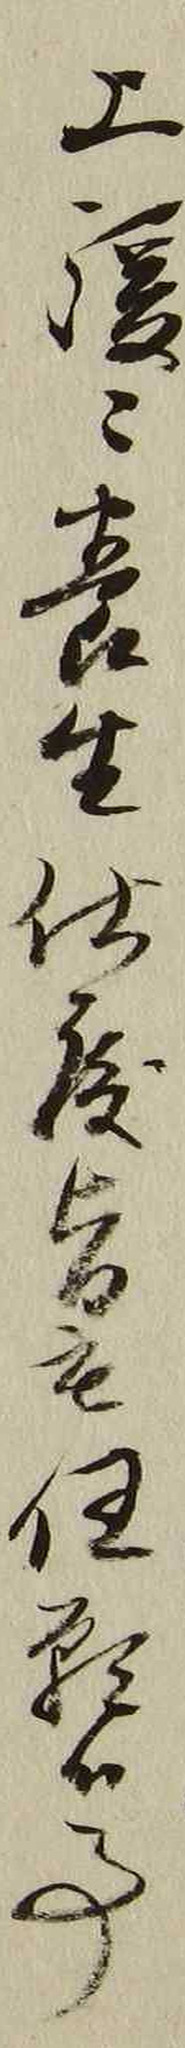上緩々養生仕度旨被任願候事
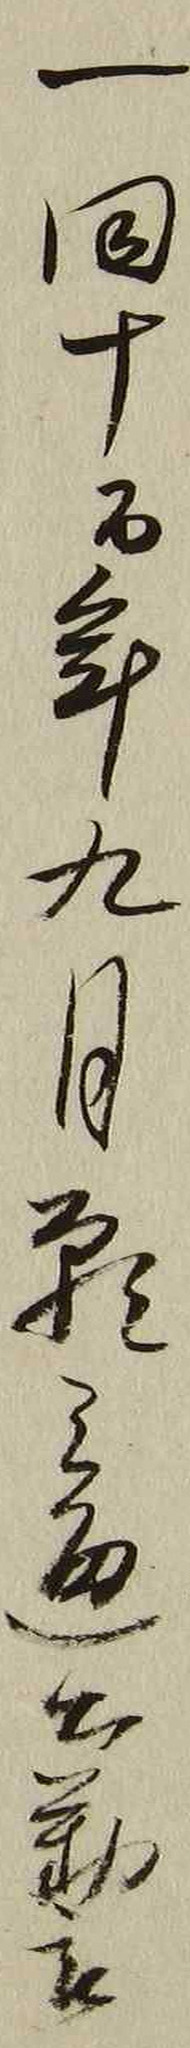一同十酉年九月願之通出勤被
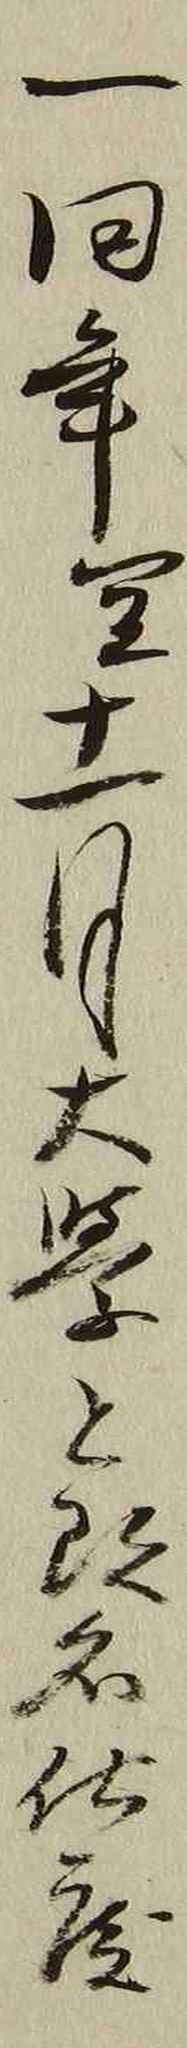一同年閏十一月大学と改名仕度
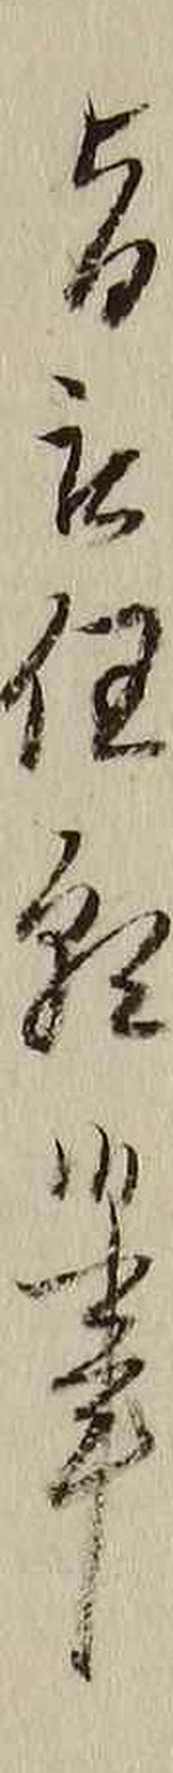旨被任願候事
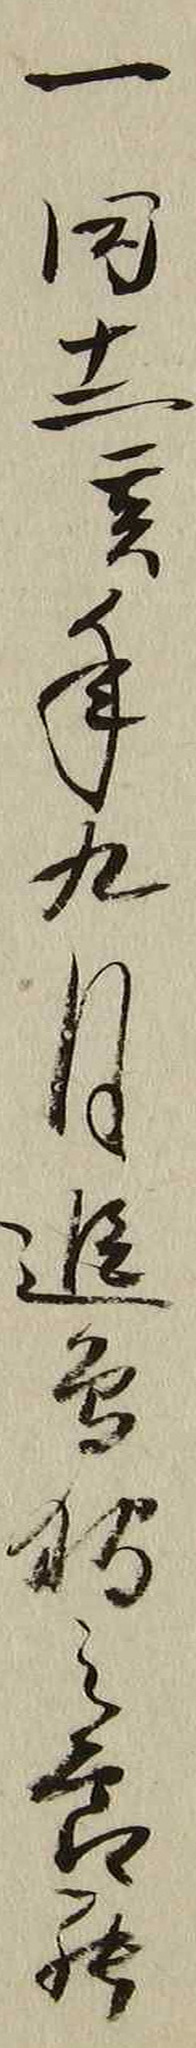一同十二亥年九月追鳥狩之節罷
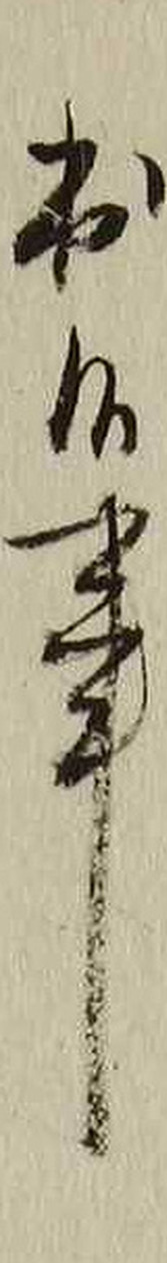出候事
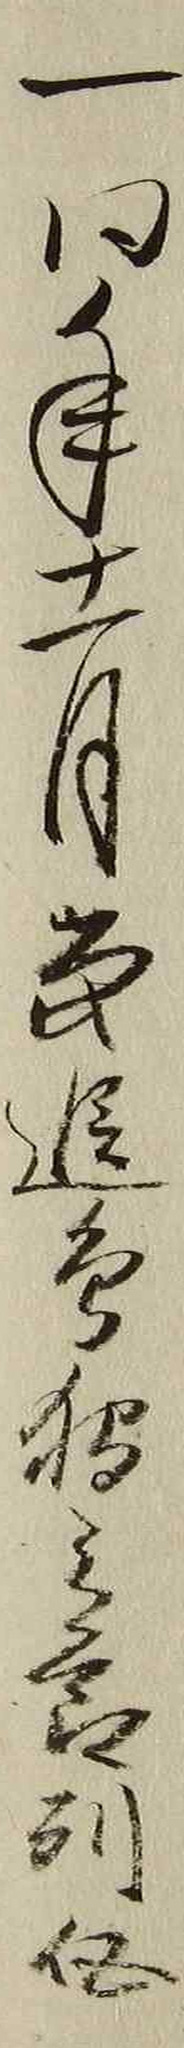一同年十一月当追鳥狩之節列伍
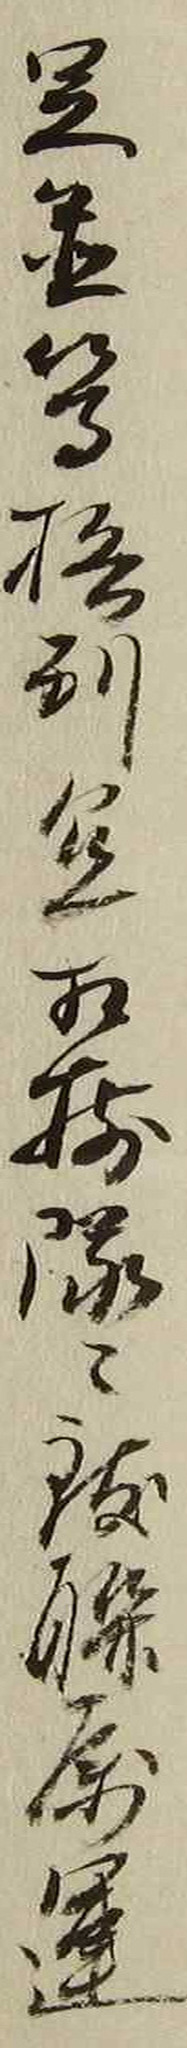足並等格別宜相揃隊々致聯属運
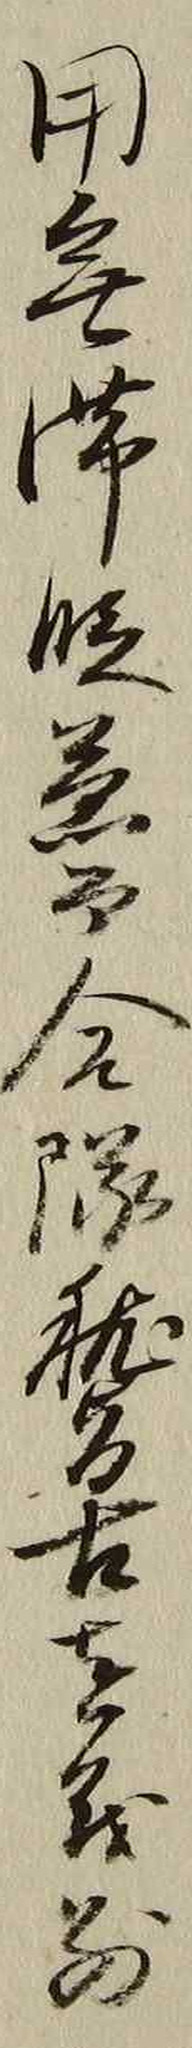用無滞段兼而合隊稽古を茂別
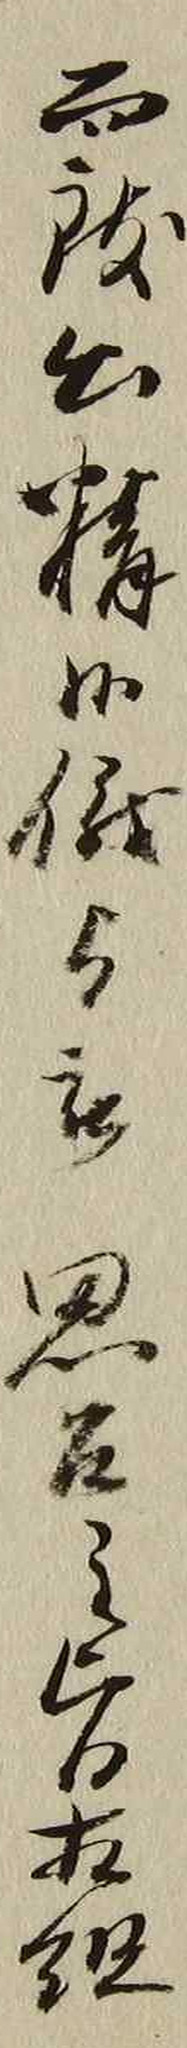而致出精候儀与被思召之旨相組
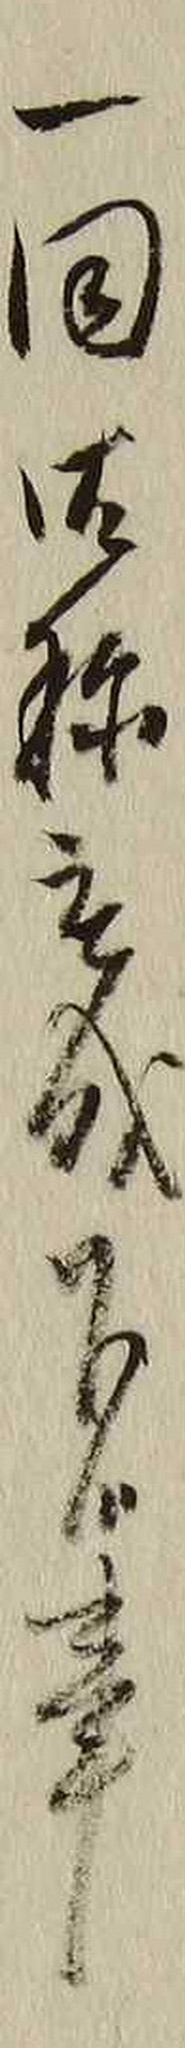一同御称被成下候事
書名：諸士系譜　巻之351　す之部1
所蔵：会津若松市立会津図書館
